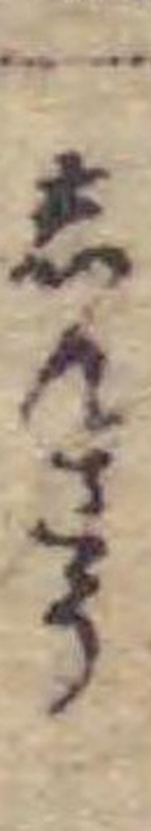しんさう
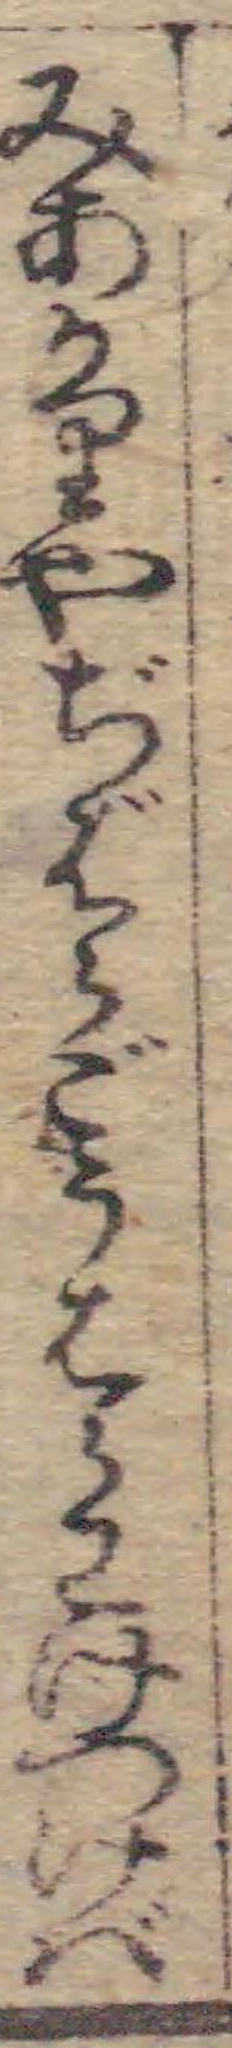みあかりやぢばらごうはらわけつけば
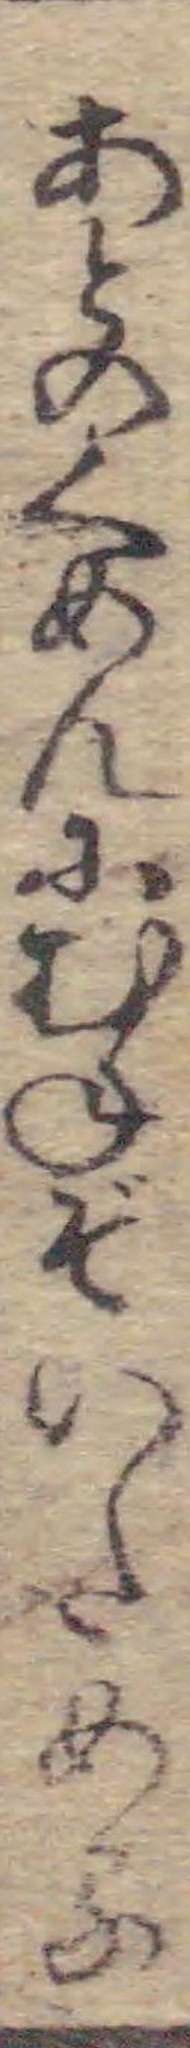あとのくめんにむねぞいためる
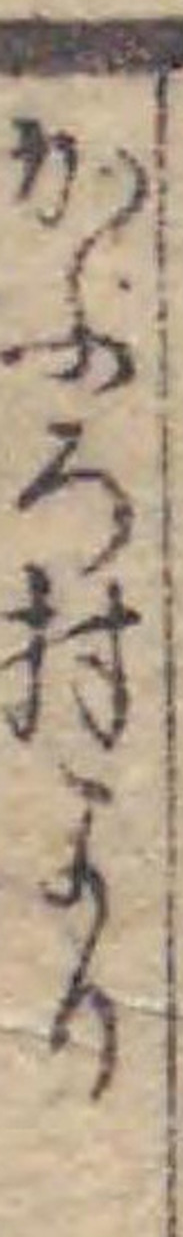かふろ村より
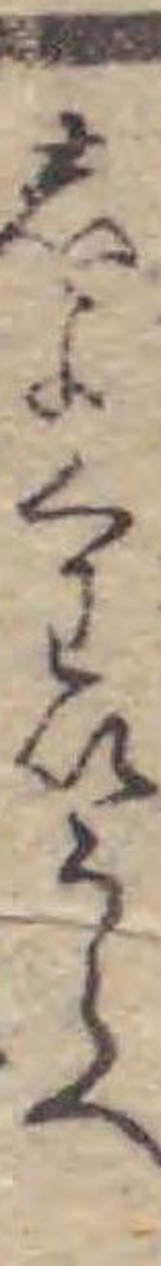しよくわいうらへ
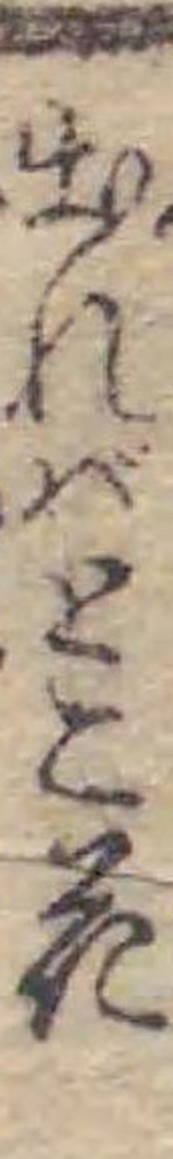出ればとこ花
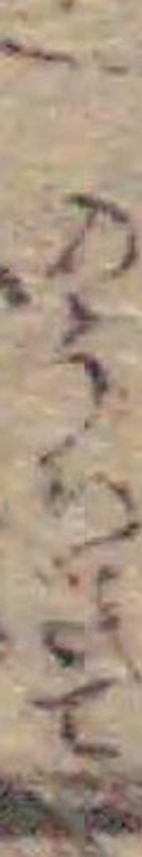のうはさで
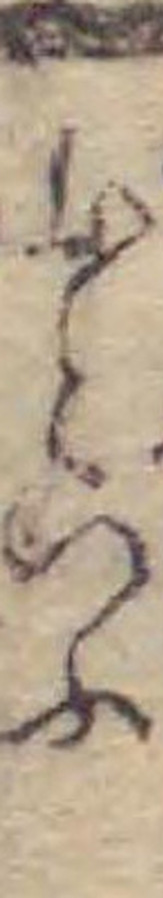山といふ
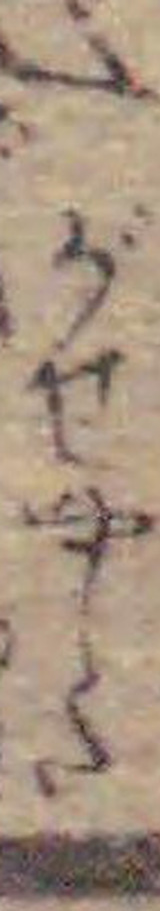がせやした
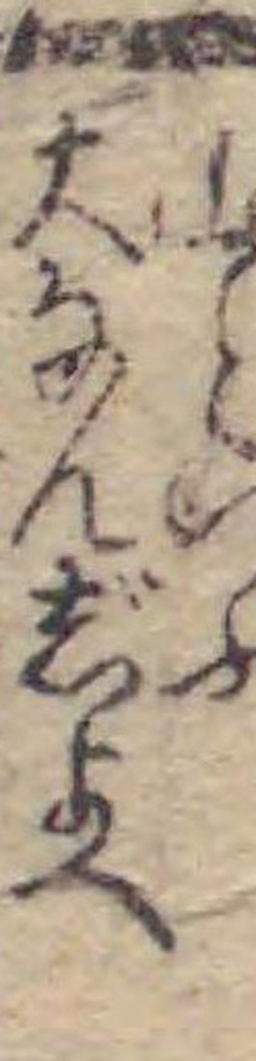大なんじよへ
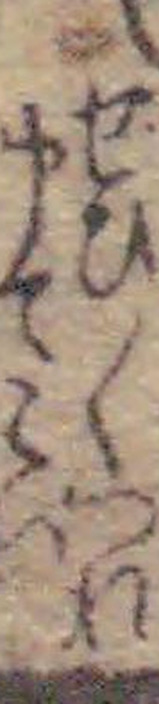ぜひ〳〵つれ
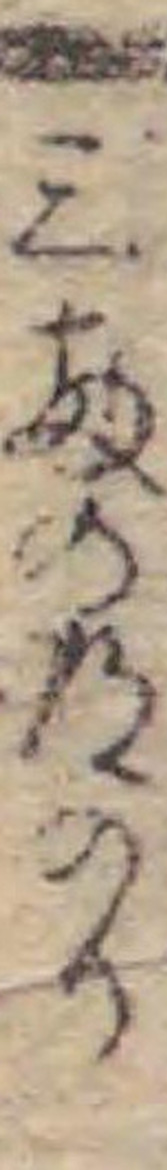三両の道のり
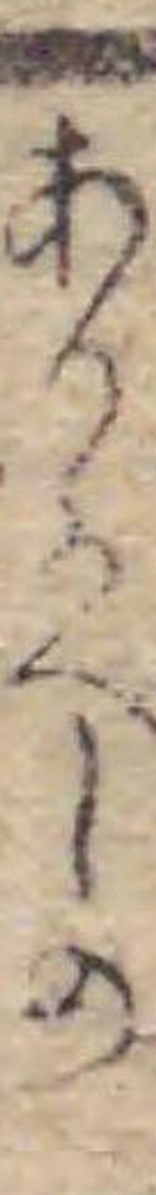ありかへしの
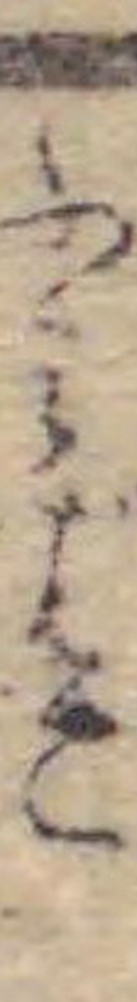ふみばこ
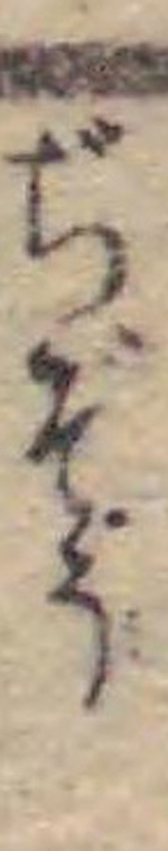ぢぞう
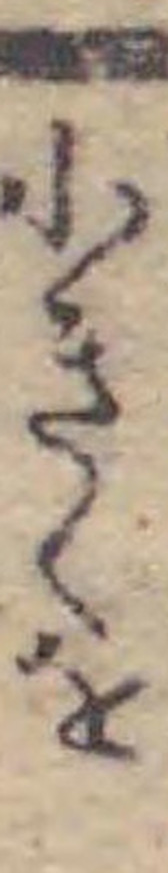小きくを
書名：北国順礼唄方便 : 3巻
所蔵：国立国会図書館 National Diet Library, JAPAN
